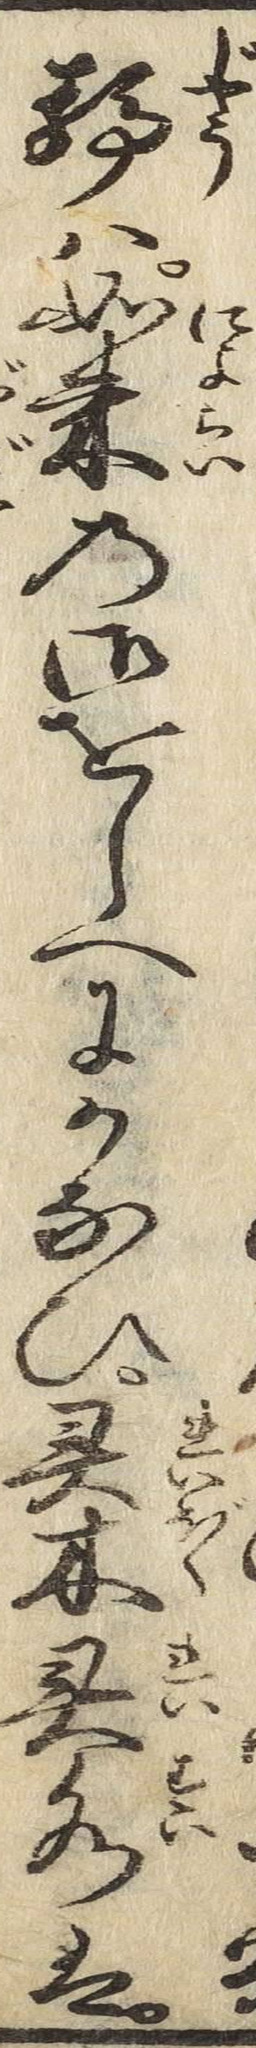浄は。如来の御をしへにかなひ。霊木霊水は。
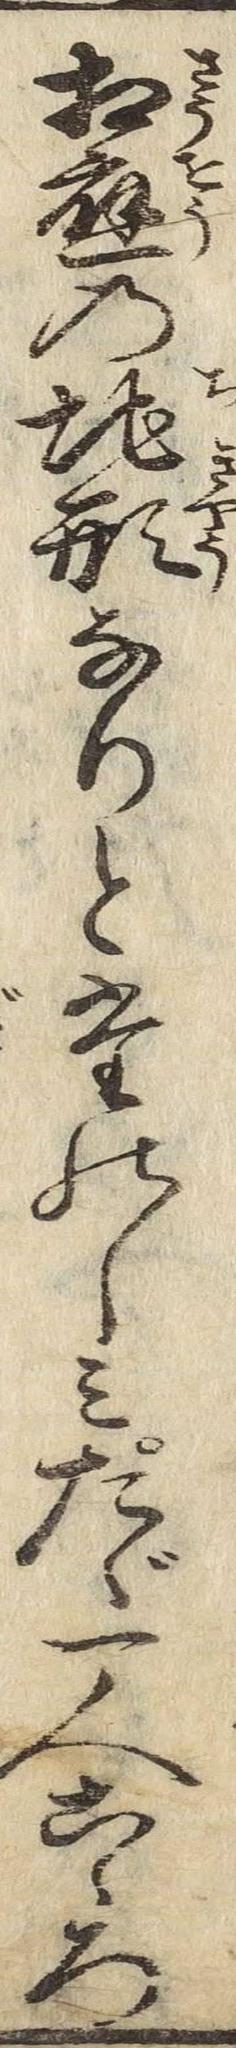相応の地行なりとたのしみ。たゞ一人こゝろ
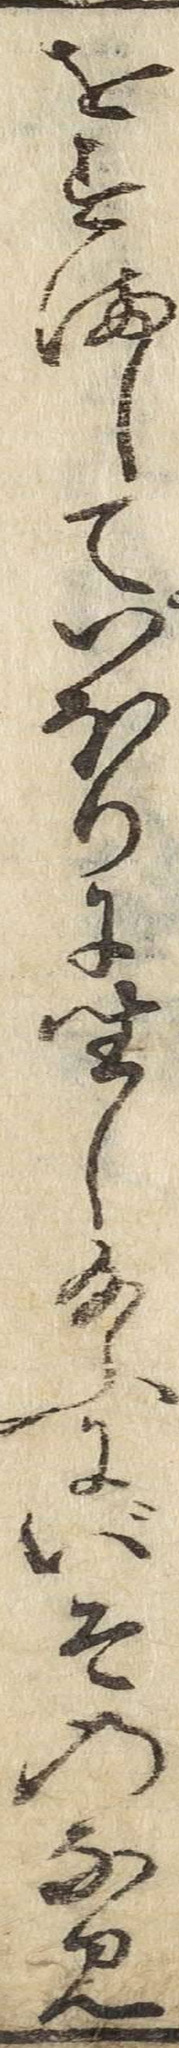をすまして。いほりに座し給ふに。いそのなみ
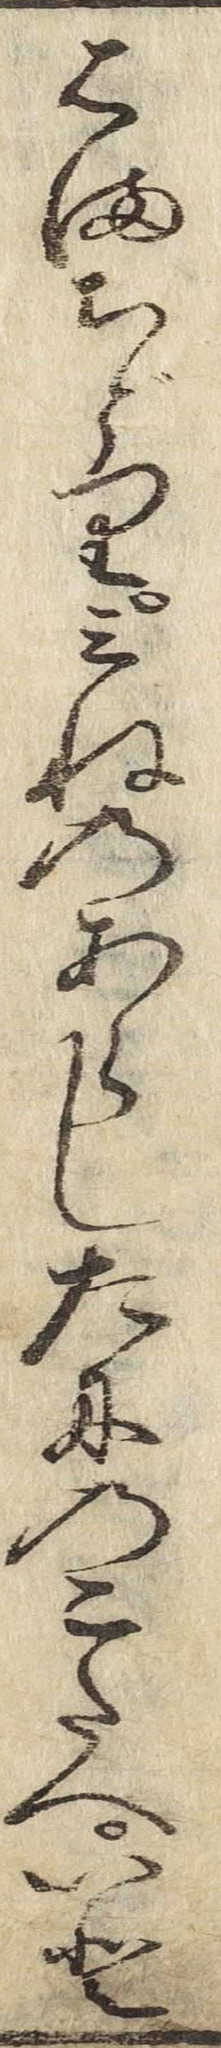はまちどり。みねのあらしたにのこたへ。いと
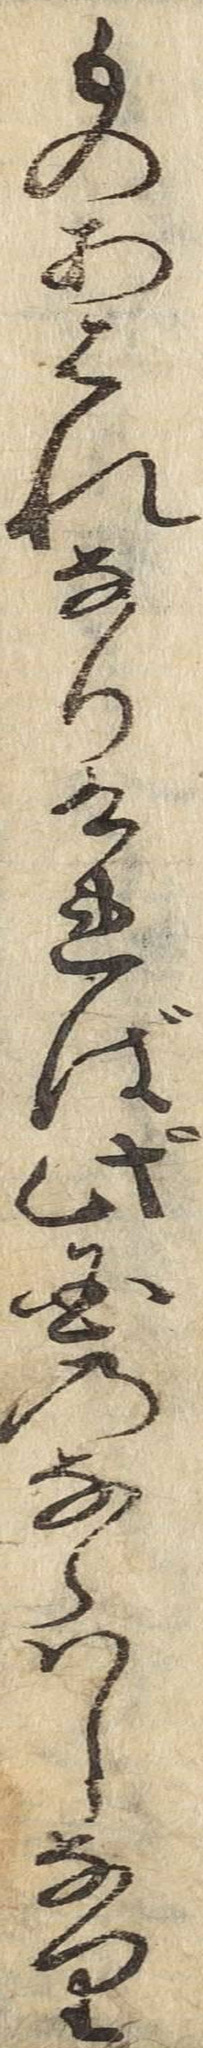ものあはれなりければ。此国のならはしなり

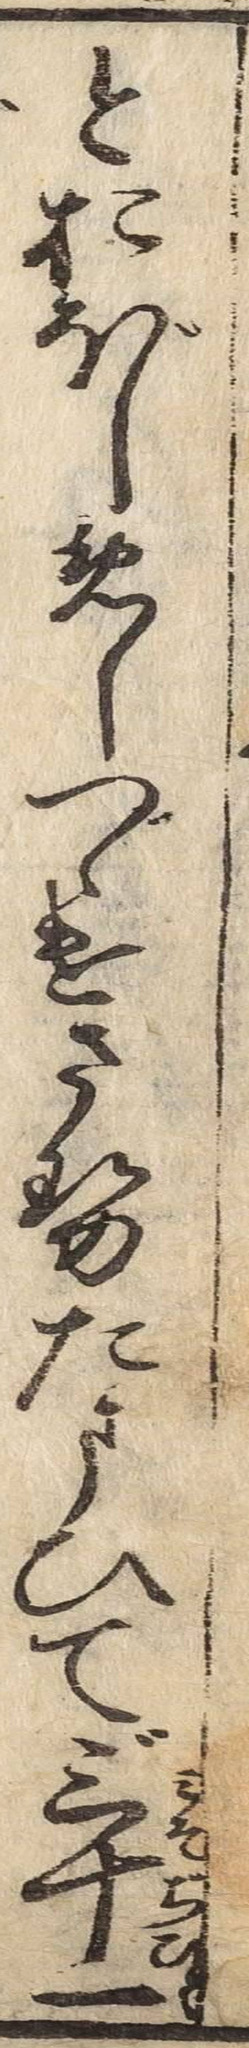とおぼしめしつゞけさせたまひて。三十一
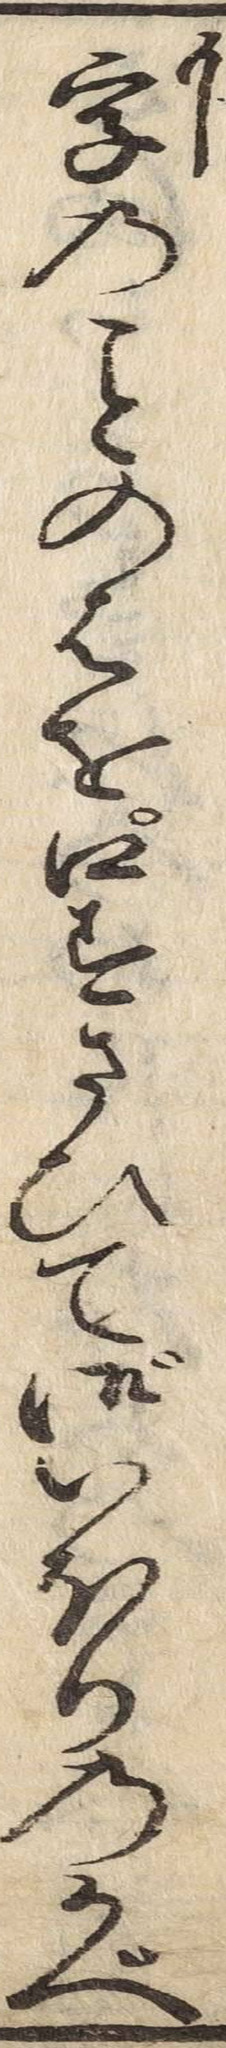文字のことのはを。口すさひて。御いほりのかべ
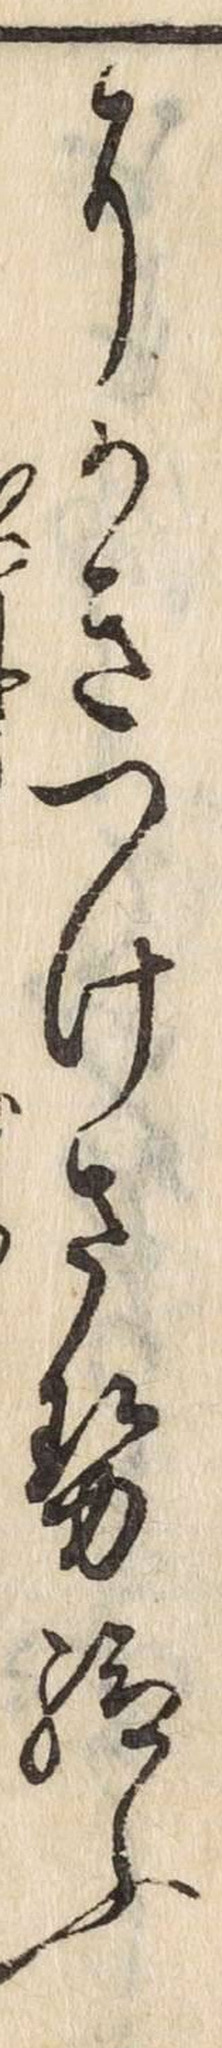にかきつけさせ給ふ
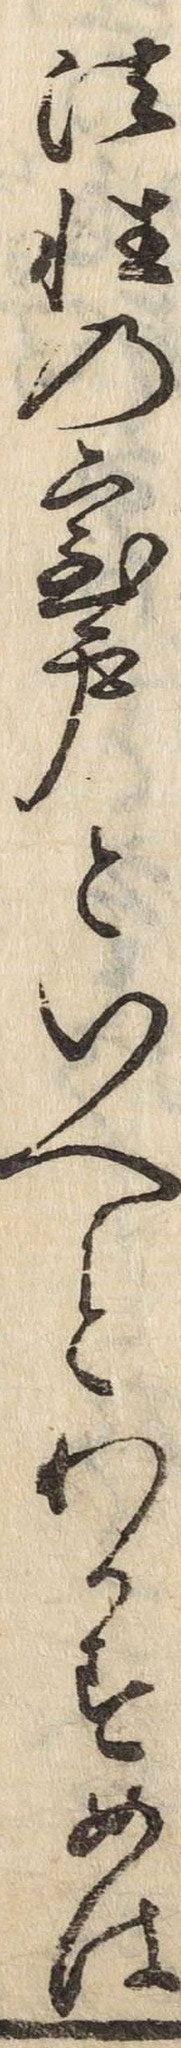法性の室戸といへとわかすめは
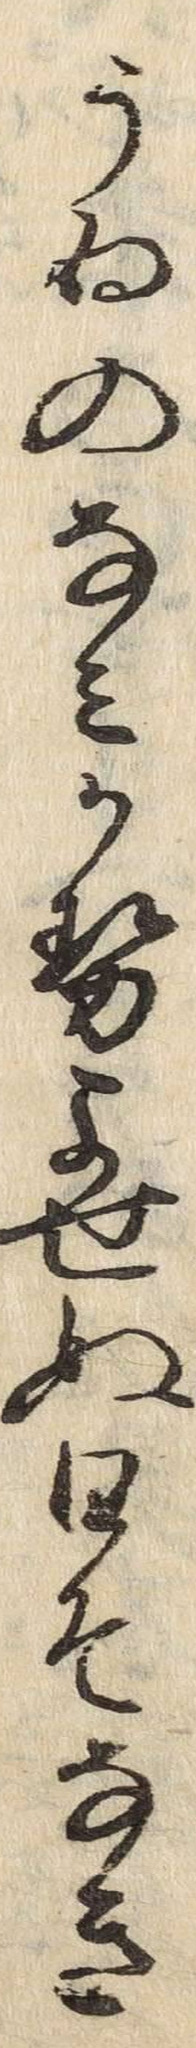うねのなみかせよせぬひそなき
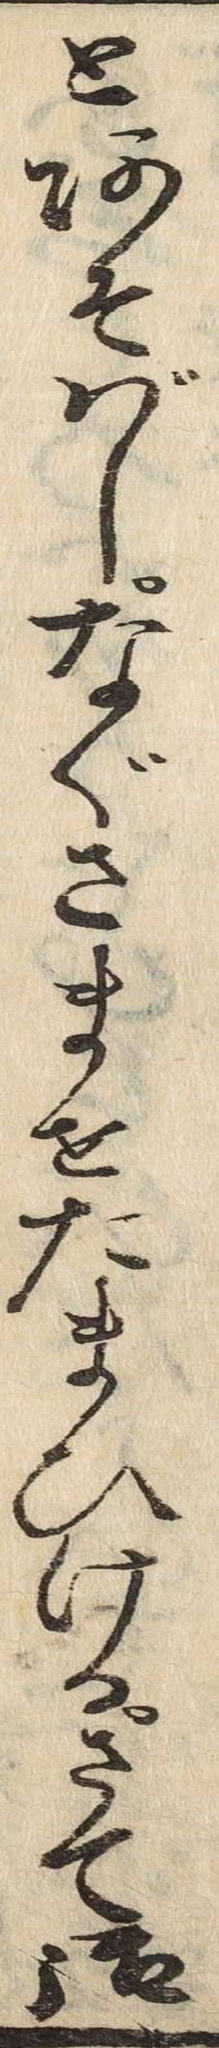とあそばし。なぐさまをたまひける。さて後
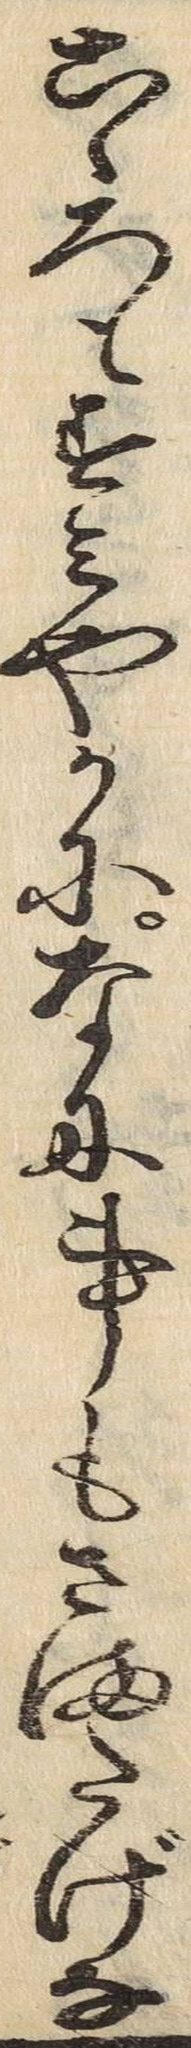こゝろもすみやかになに後ともさまたげな
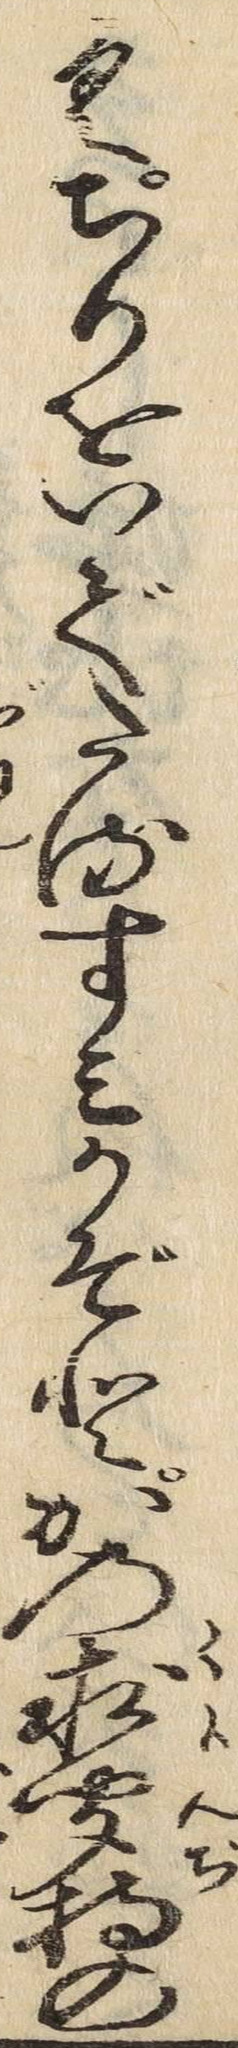く。ちりをいでたますみかぞとかの求聞持の
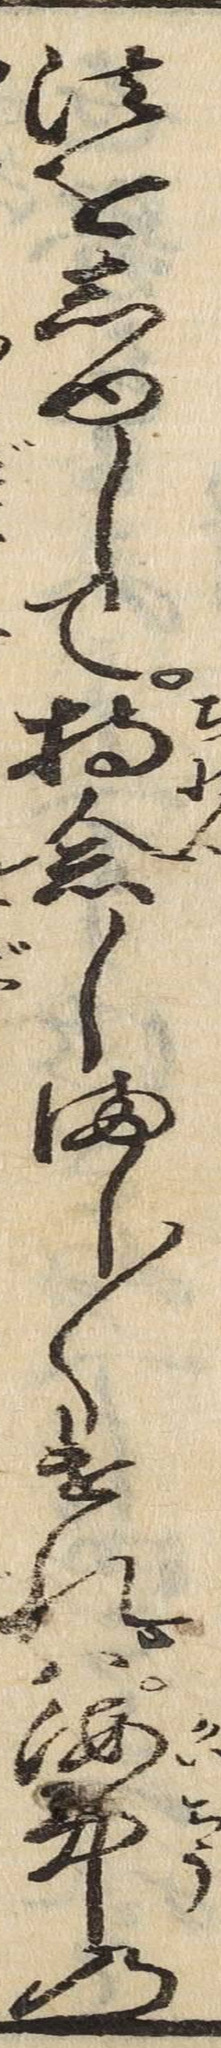法をしゆして。持念しまし〳〵ければ海中の
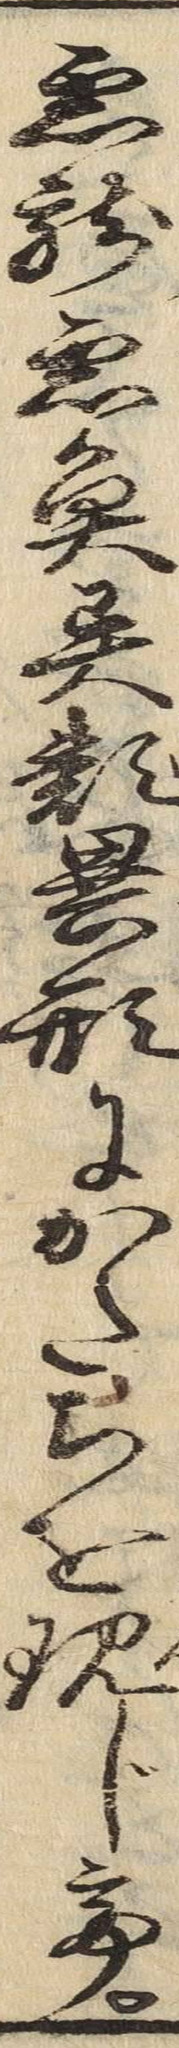悪竜悪魚異類異形にかたちを現じて。
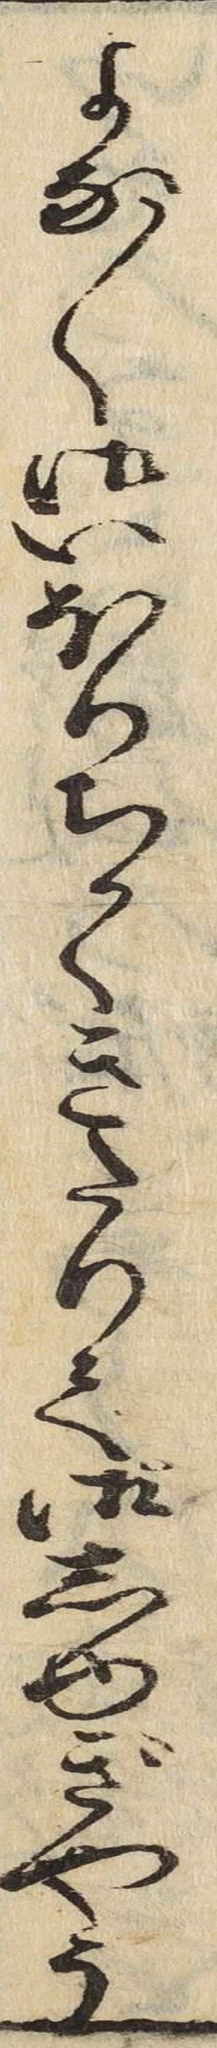よな〳〵御いほりちかくきたりて御しゆぎやう
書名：弘法大師御傳記
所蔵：京都府立京都学・歴彩館 国文学研究資料館
